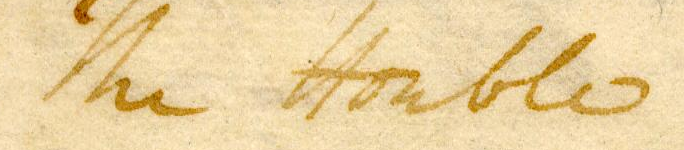The Honble
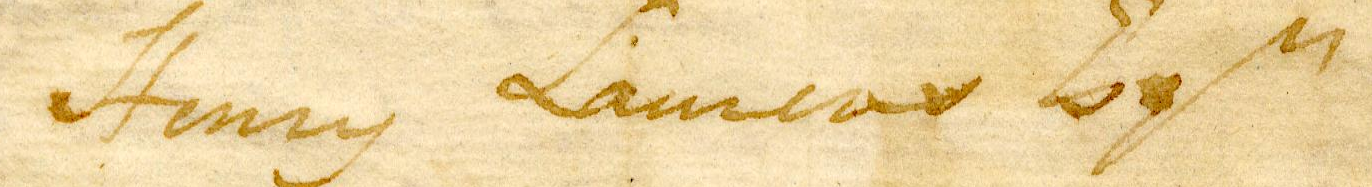Henry Laurens Esq^r
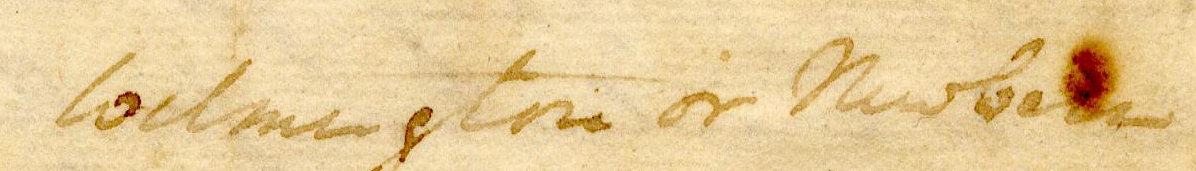Wilmington or Newborn
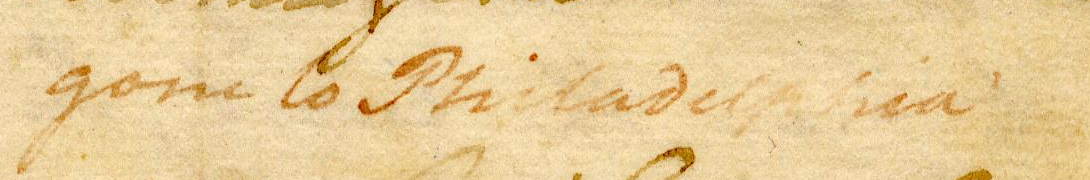gone to Philadelphia
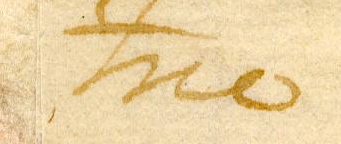Inc
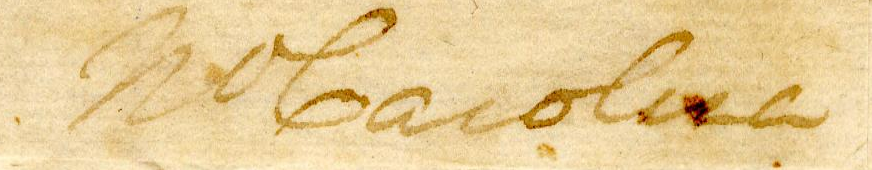N^o Carolina
